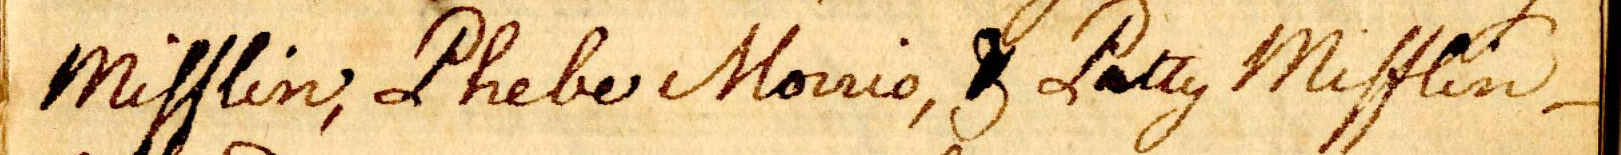Mifflin, Phebe Morris, & Patty Mifflin-
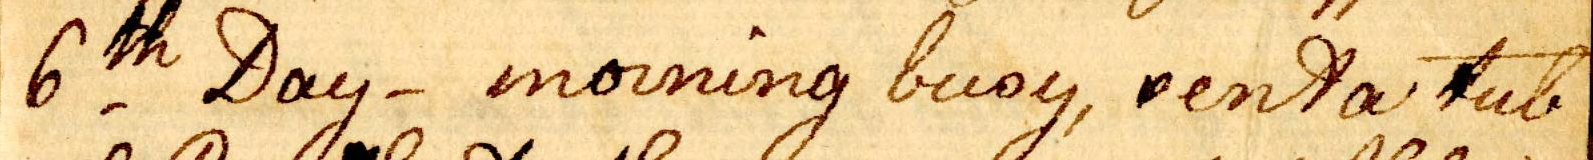6^th Day- morning busy, sent a tub
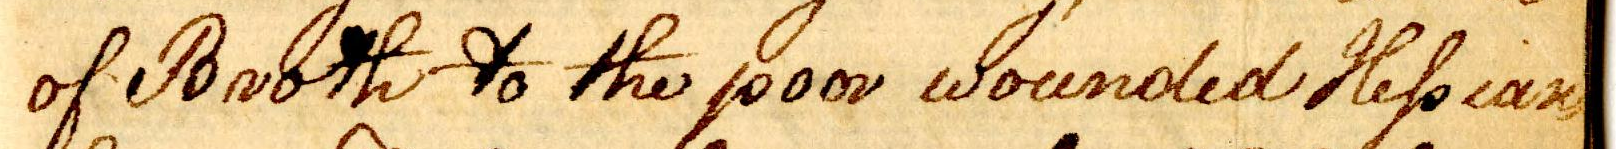of Broth to the poor wounded Hessian
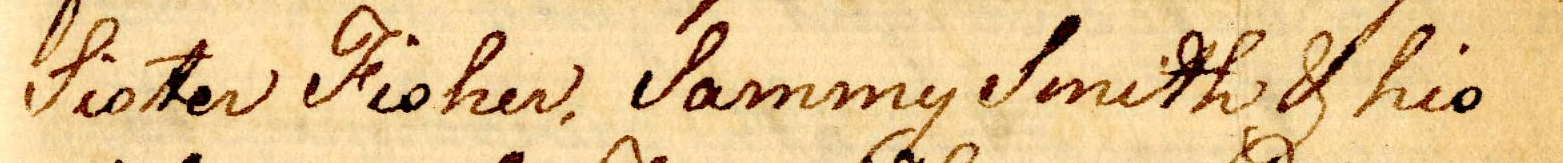Sister Fisher, Sammy Smith & his
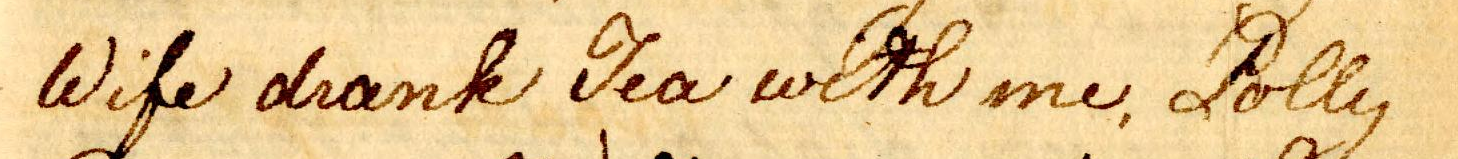Wife drank Tea with me, Polly
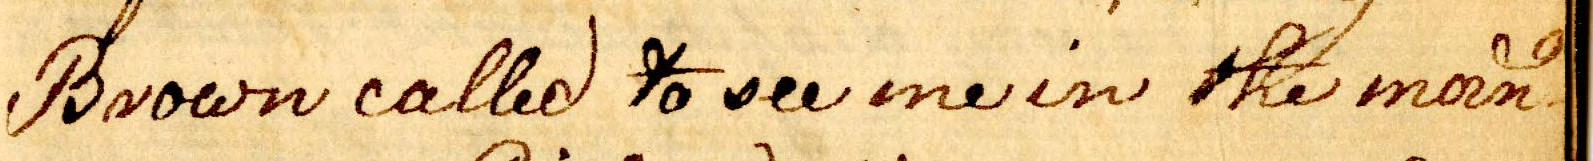Brown called to see me in the morn^g.
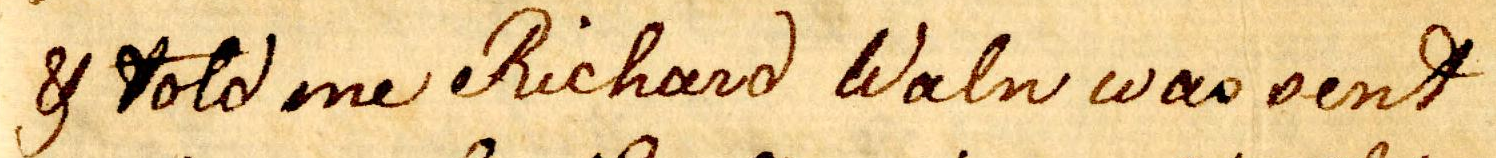& told me Richard Waln was sent
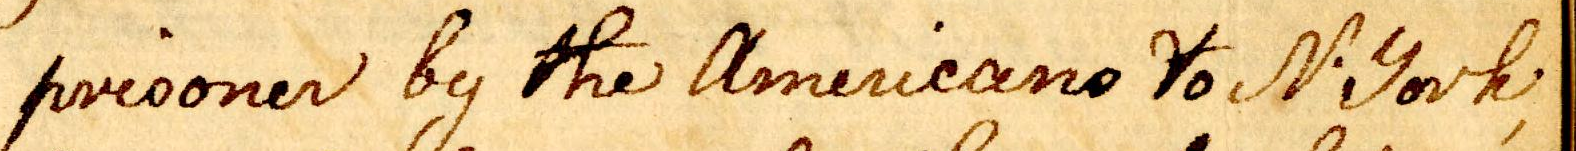prisoner by the Americans to N York
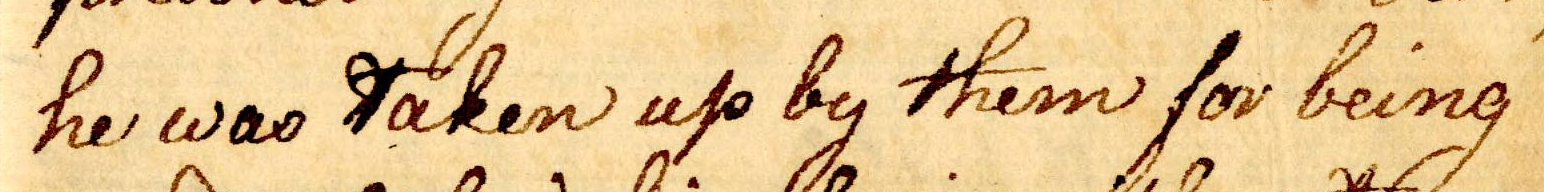he was taken up by them for being
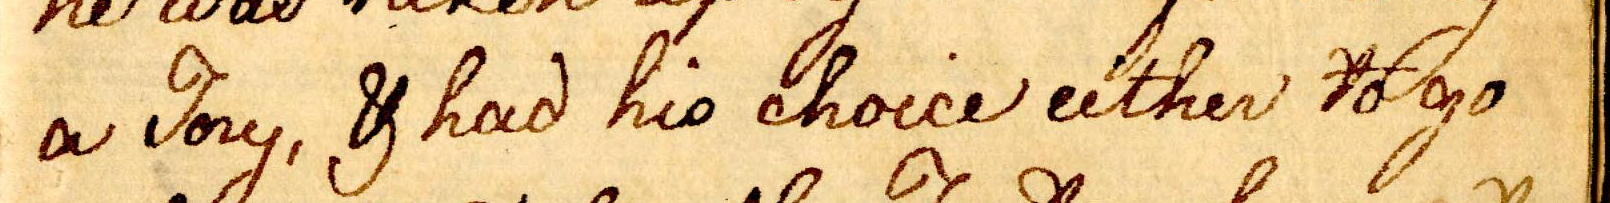a Tory, & had his choice either to go
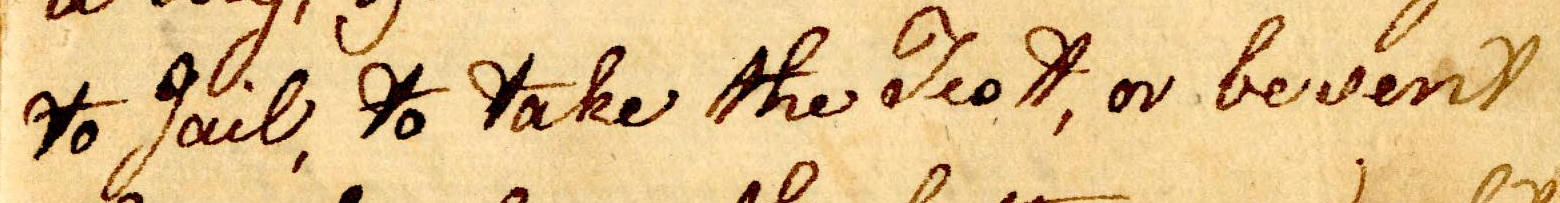to Jail, to take the Test, or be sent
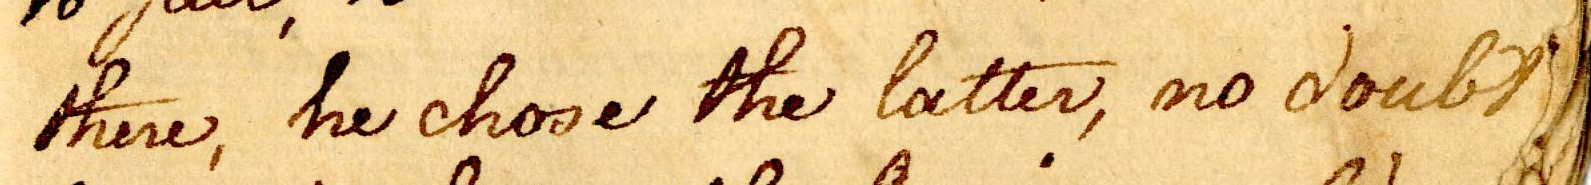there, he chose the latter, no doubt
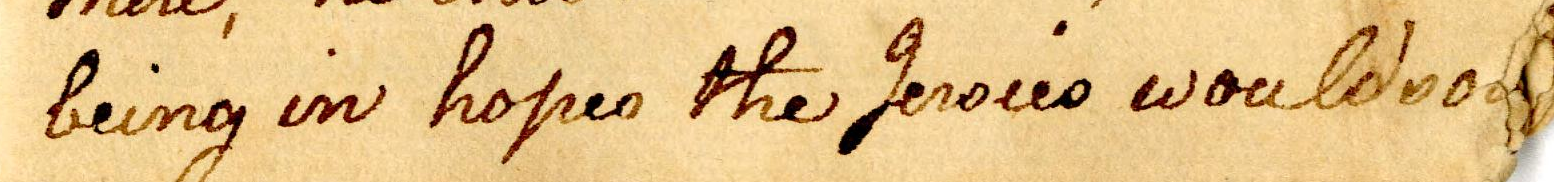being in hopes the Jersies would soo
